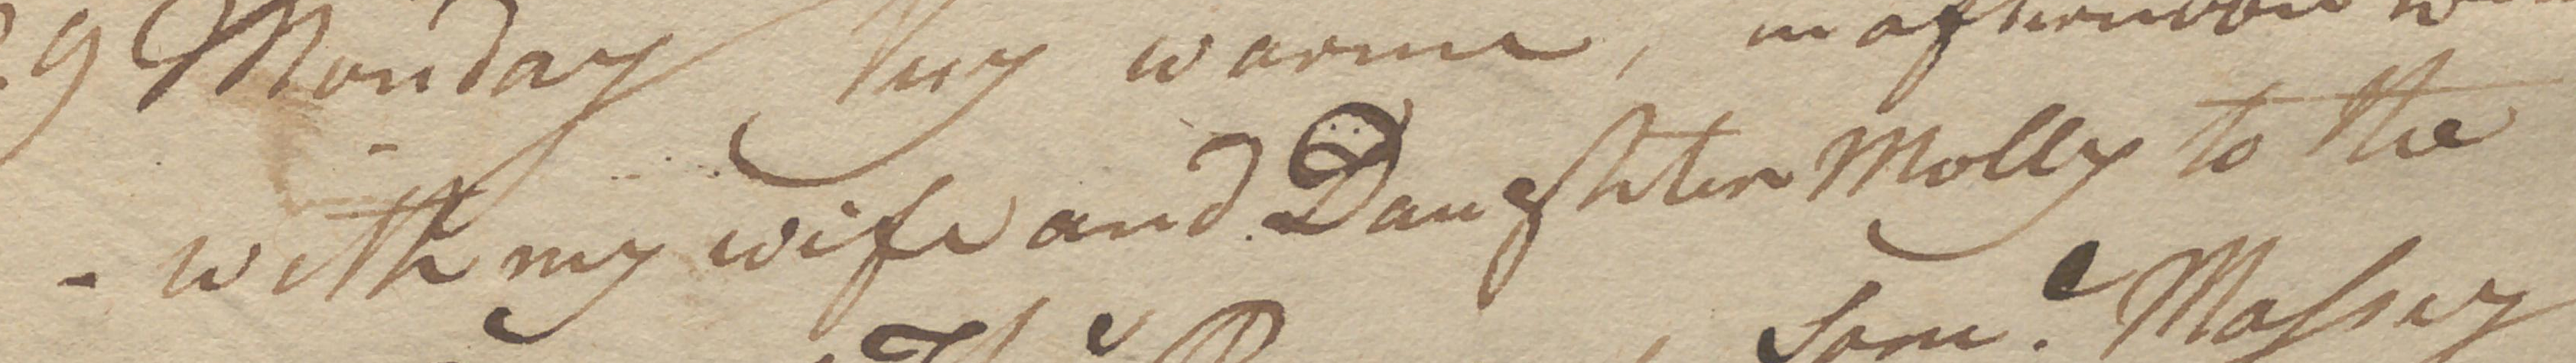with my wife and Daughter Molly to the
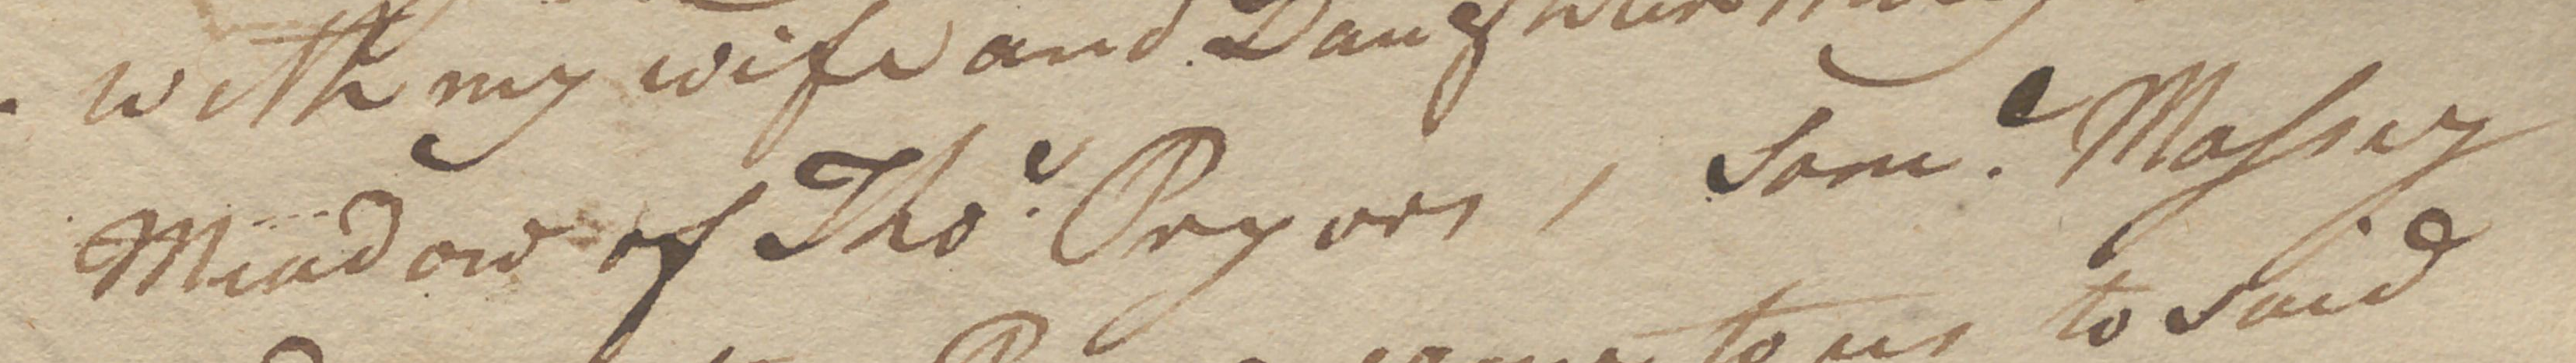Meadow of Tho^s. Pryors, Sam^l. Massey
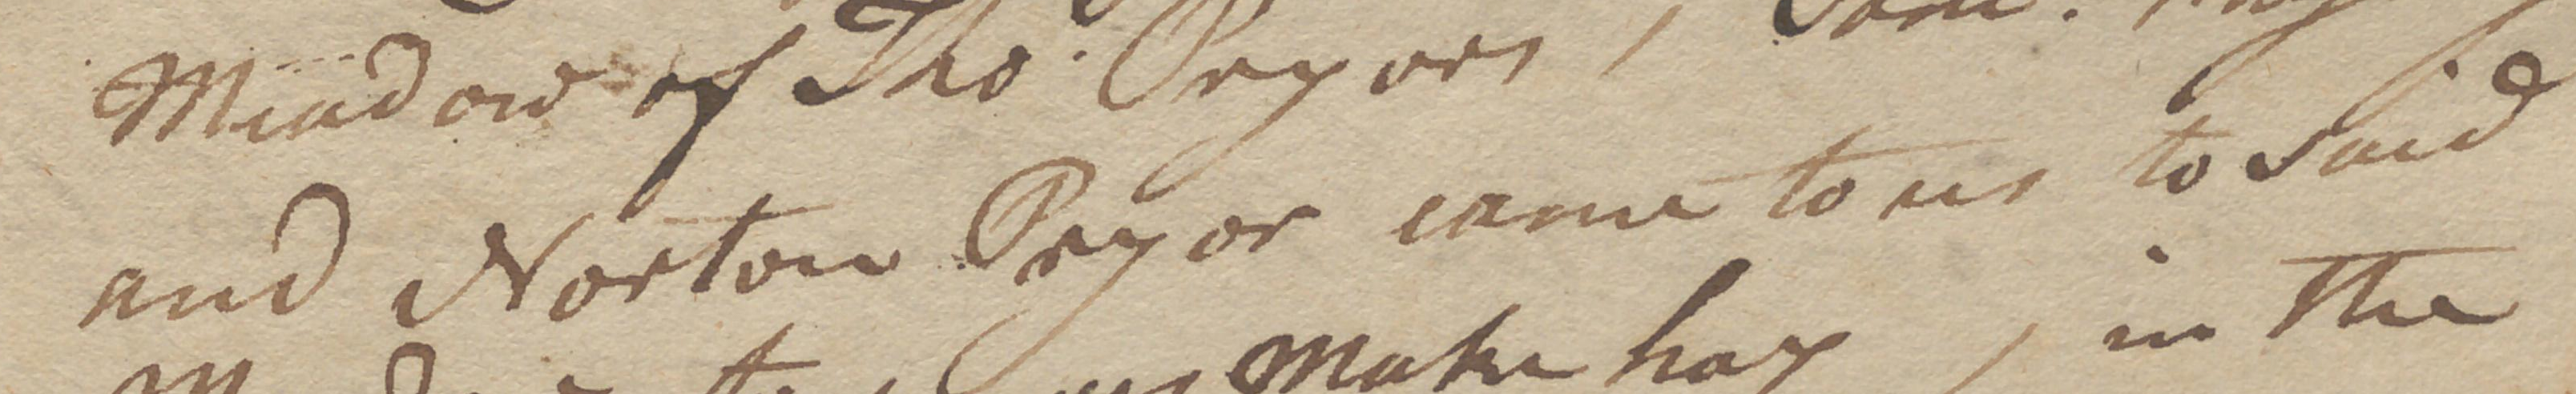and Norton Pryor came to us to said
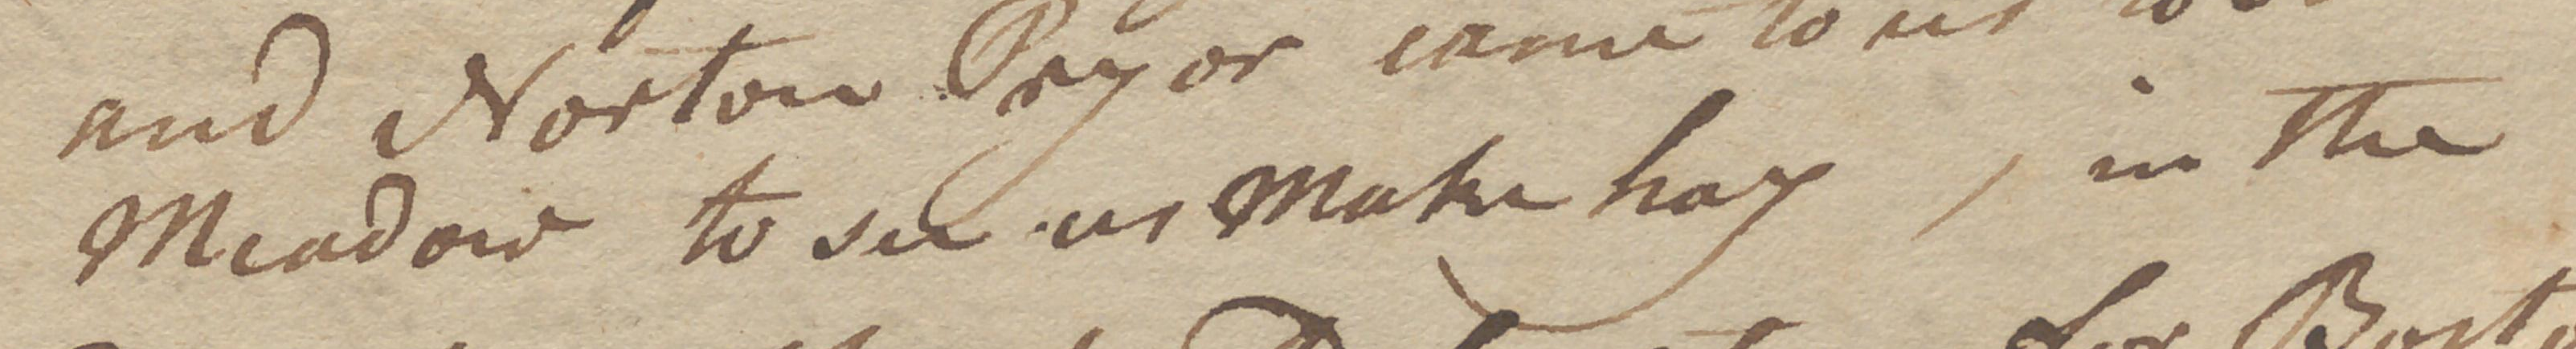Meadow to see us Make hay, in the
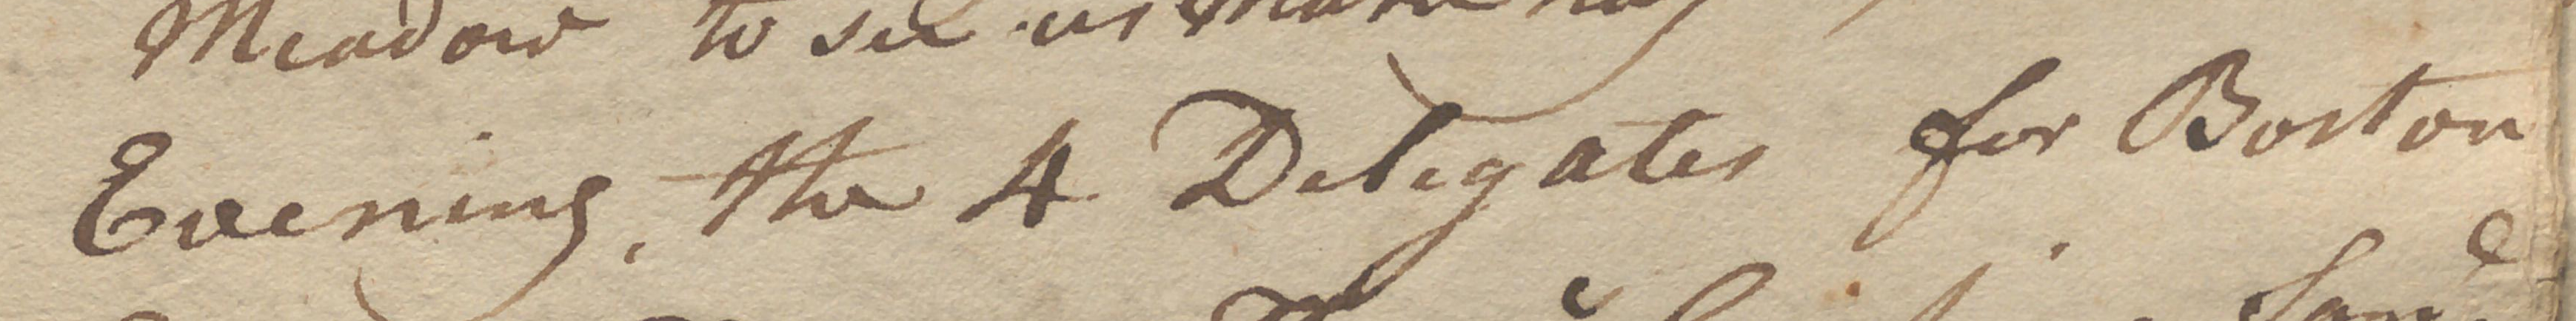Evening the 4 Delegates for Boston
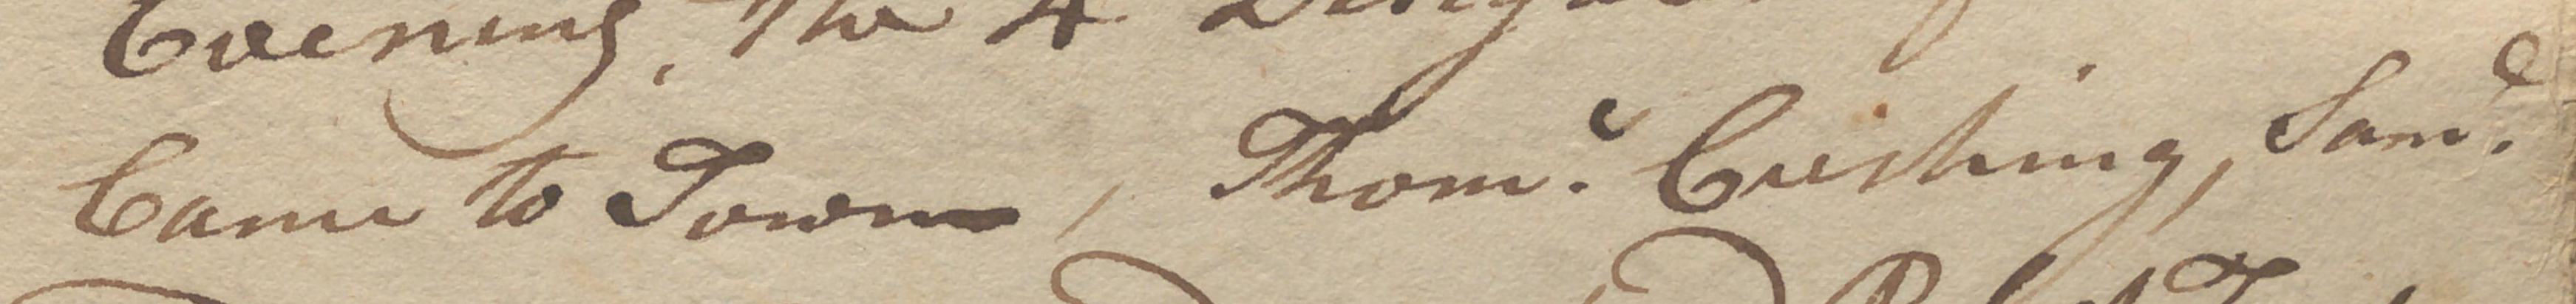Came to Towm, Thom^s. Cushing, Sam^l.
